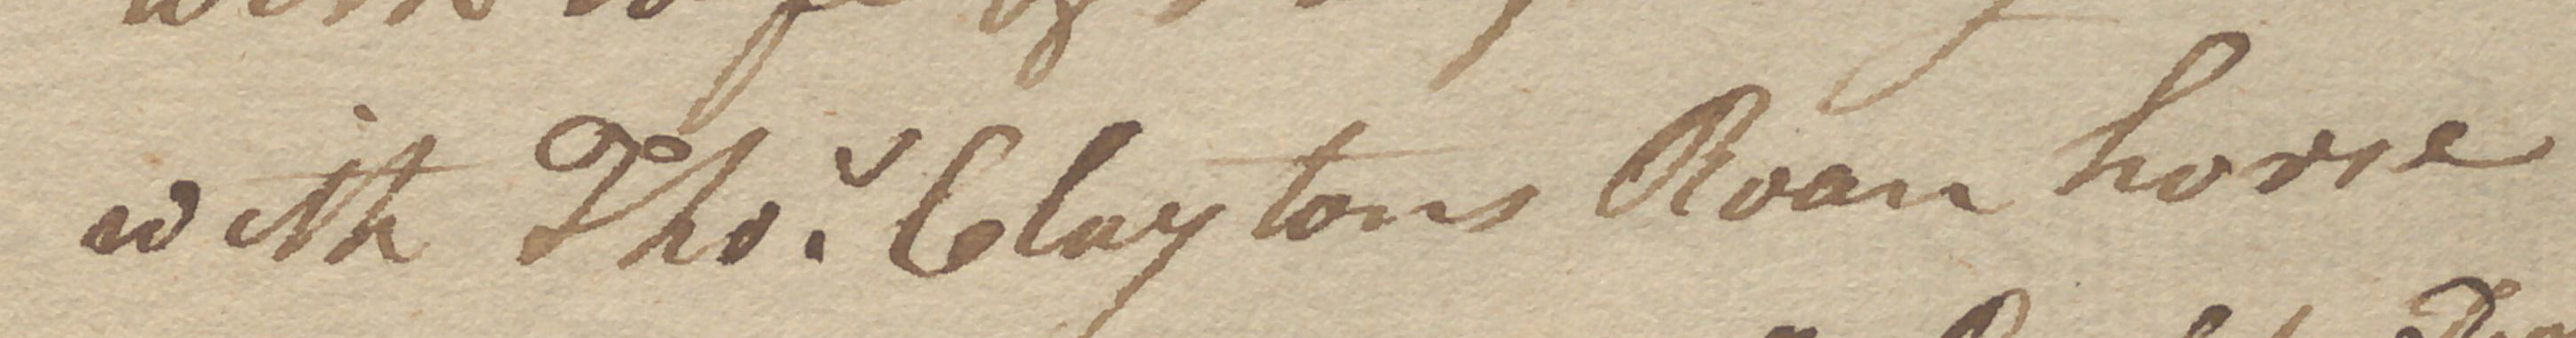with Tho^s. Claytons Roan horse
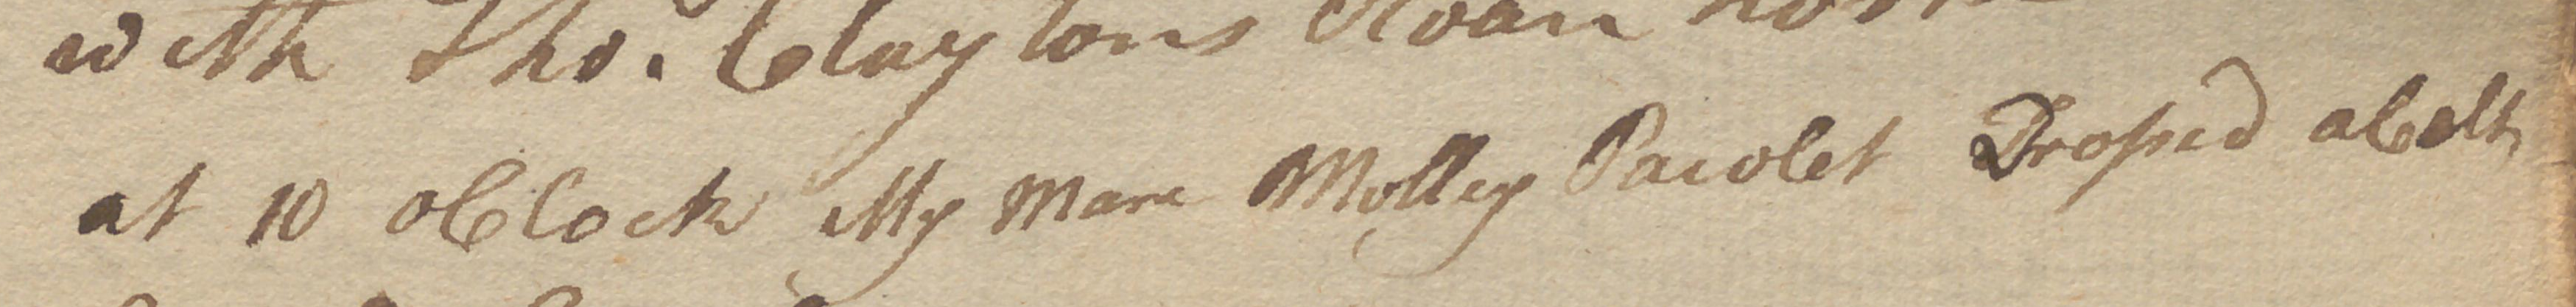at 10 oClock My Mare Molley Pacolet Droped a Colt
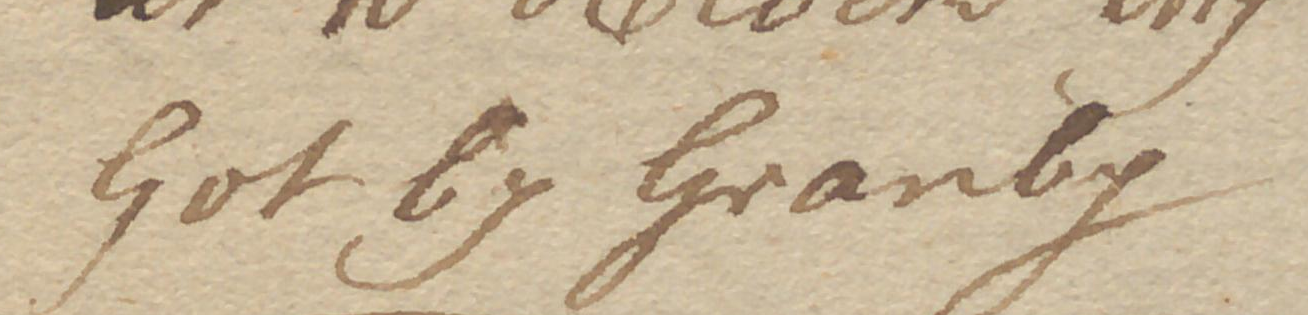Got by Granby
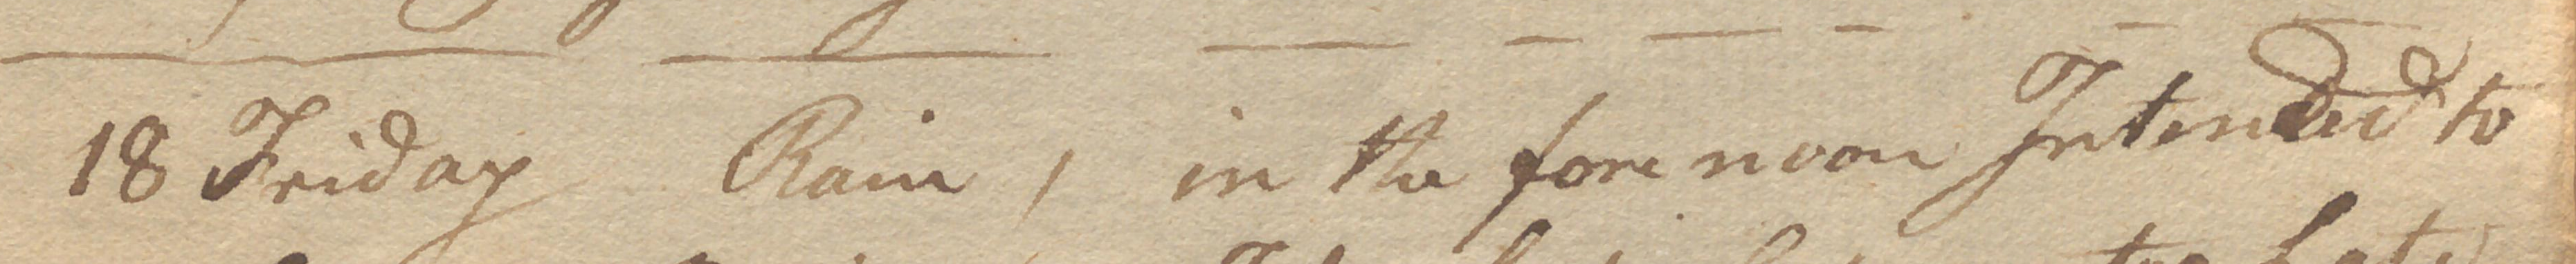18 Friday Rain, in the forenoon Intented to
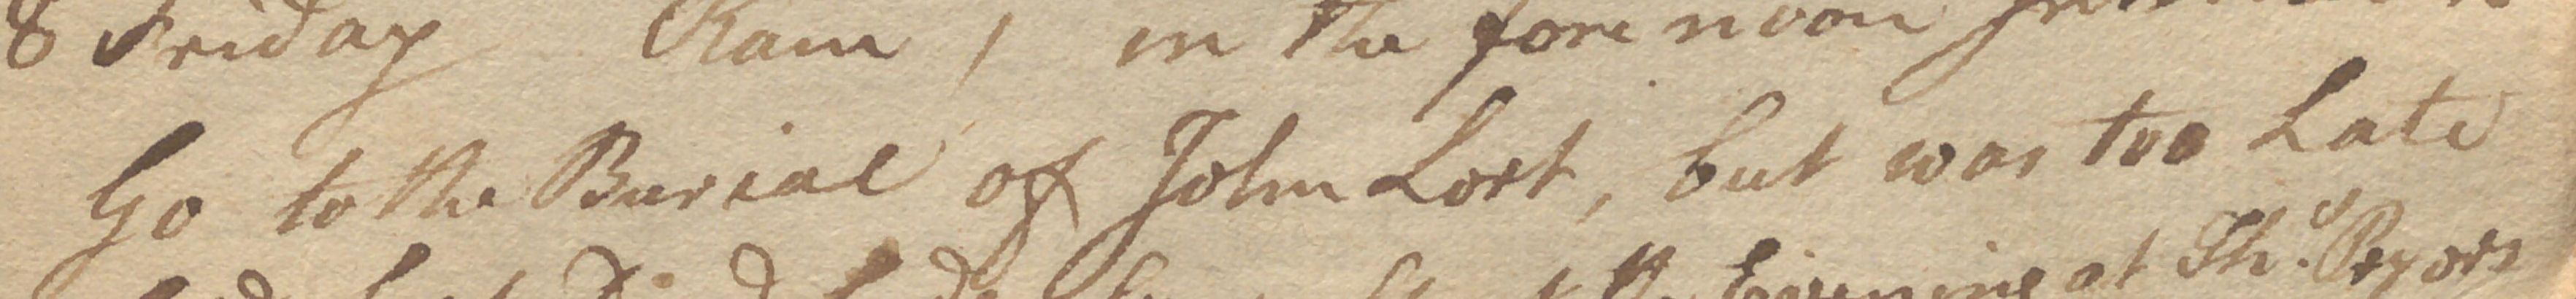Go to the Burial of John Lort, but was too Late
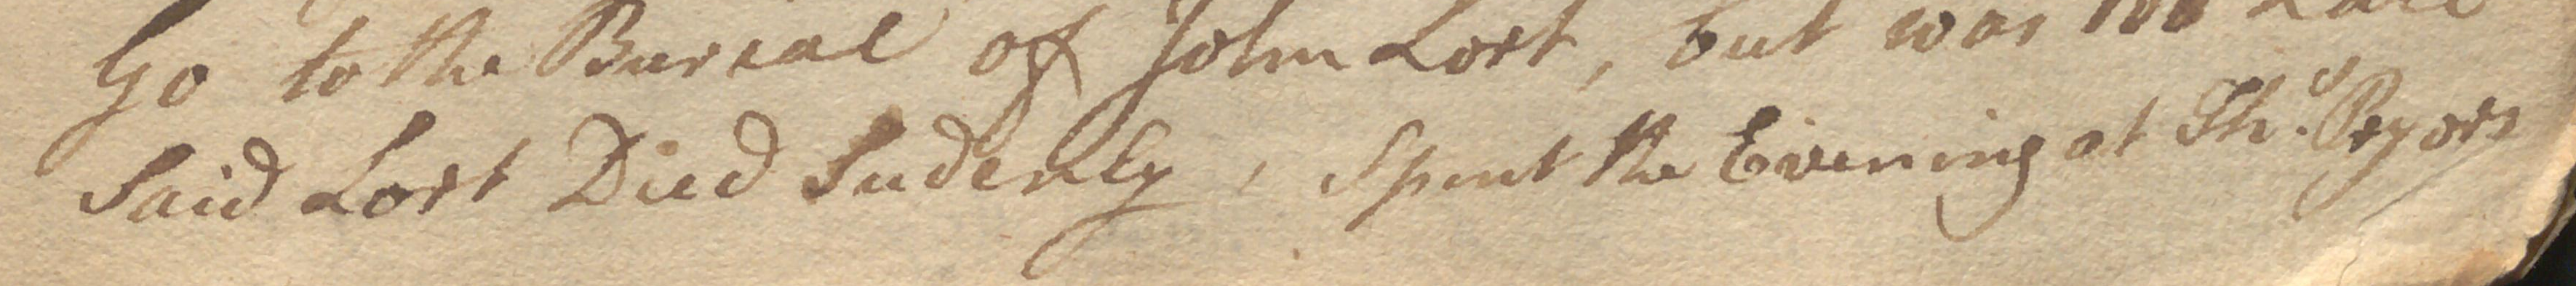Said Lort Died Sudenly, spent the Evening at Th^s. Pryors
